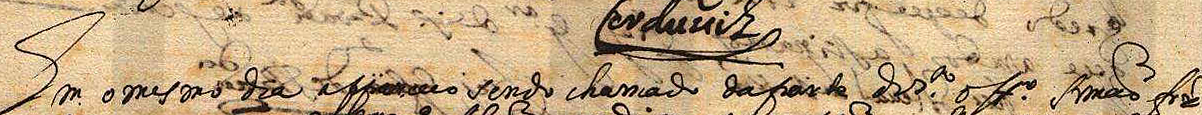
Em o mesmo dia appareceo sendo chamado da parte do s.to off.o Simaõ frz̄
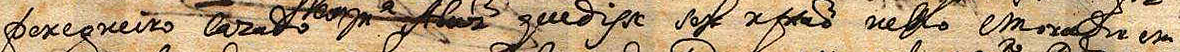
Pexegueiro cazado com ma Aluz̄ que disse ser xptão uelho e morador em
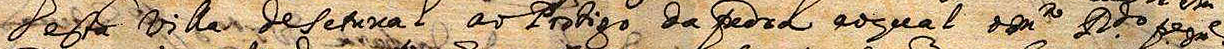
esta villa de Setuual ao Postigo da pedra ao qual o mto R.do p.e me
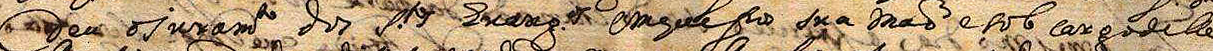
deu o Iuramto dos s.tos Euang.os em que pos sua maõ e sob cargo delle
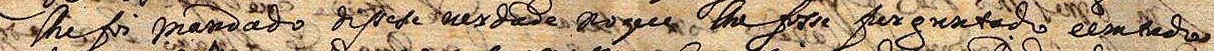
lhe foi mandado dissese uerdade no que lhe fosse perguntado e em tudo
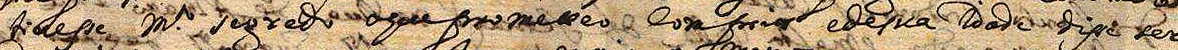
tiuesse m.to segredo o que prometteo comprir e de sua Idade disse ser
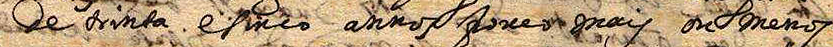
de trinta e sinco annos pouco mais ou menos
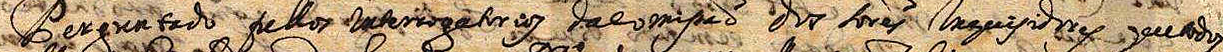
Perguntado pellos Interrogatorios da comissão dos sores̄ Inquisidores que todos
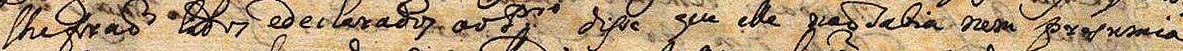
lhe forão lidos e declarados ao P.ro disse que elle não sabia nem presumia
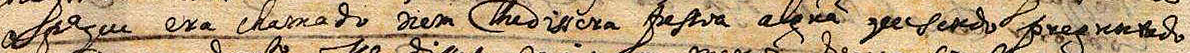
o pa que era chamado nem lhe dissera pessoa alguā que sendo preguntado
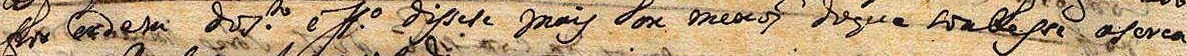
por ordem do s.to off.o dissese mais ou menos do que soubesse aserca
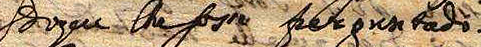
do que lhe fosse perguntado
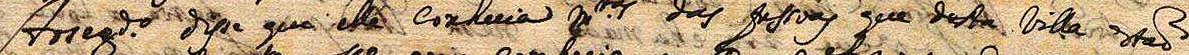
Ao seg.do disse que elle conhecia m.tas das pessoas que desta Villa estão
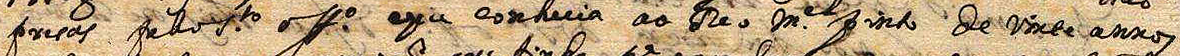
presas pello s.to off.o e que conhecia ao Reo m.el pinto de vinte annos
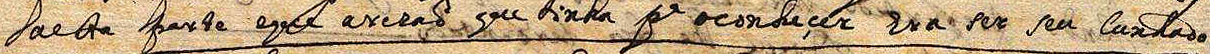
a esta parte e que a rezaõ que tinha pa o conheçer Era ser seu Cunhado
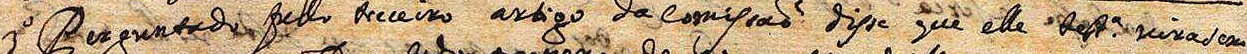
3º Perguntado pello treceiro artigo da comissaõ disse que elle test.a uira sem
